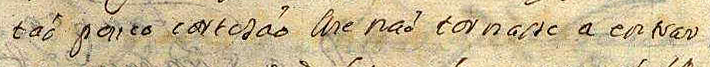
taõ pouco cortesaõ lhe naõ tornasse a entrar
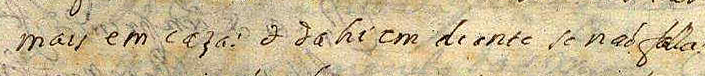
mais em caza: & dahi em diante se naõ falla
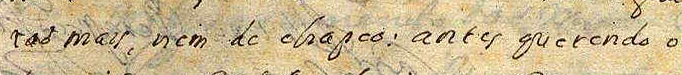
raõ mais, nem de chapeo: antes querendo o
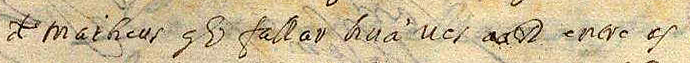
d̄ matheus glz fallar huā ues ao R entre as
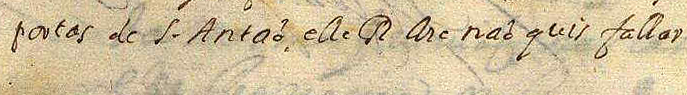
portas de S. Antaõ, elle R lhe naõ quis fallar
